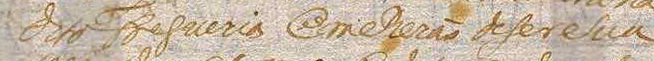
dita freguezia em Rezaõ de ser Sua
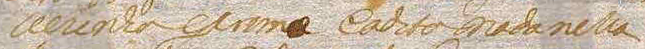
uezinha e prima e a dita madanella
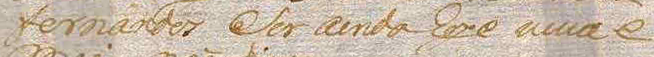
fernandes Ser ainda hoje uiua e
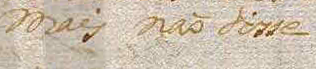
mais naõ disse
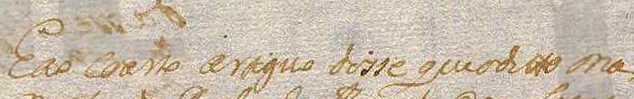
E ao coarto artiguo disse que o ditto ma
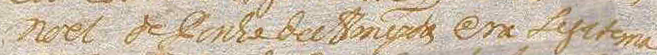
noel de Pinho de Almeyda era Legitema
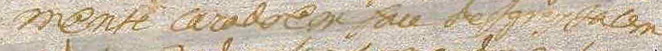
mente cazado em face de JgreyJa com
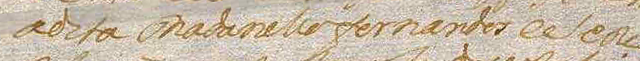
a dita Madanella fernandes e Se Re
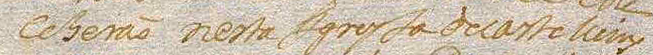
ceberaõ nesta IgreyJa de casteloins
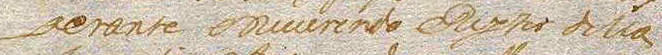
perante o Reuerendo Reytor della
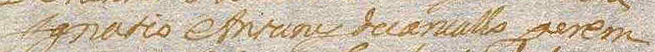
Jgnasio Antunes de caruallo porem
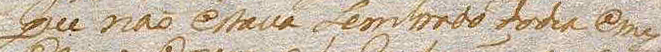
que naõ estaua Lembrado do dia e mes
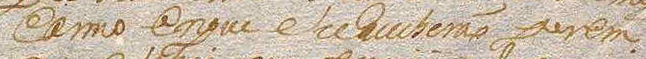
E anno en que Se Receberaõ porem
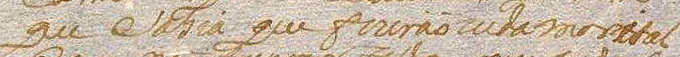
que Sabia que fizeraõ uida marital
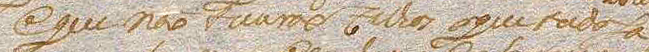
E que naõ tiueram filhos o que tuda sa
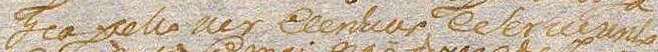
bia pella uer e conhecer E Ser uizinho
